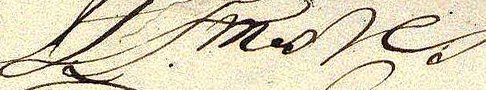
Illmos ses
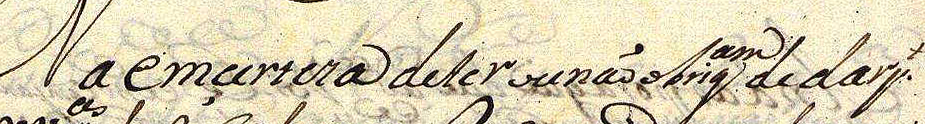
Na emcerteza de ter ou naõ obrg.am de dar p.te
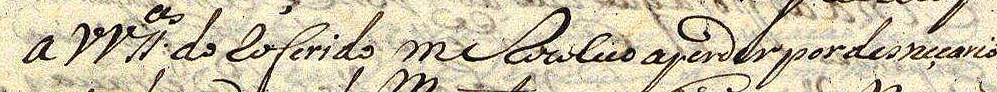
a VVSS.as do Roferido me Rosoluo a perder por desneçario
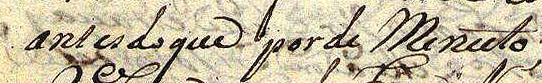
antes do que por de Menuto
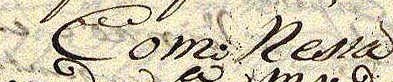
Com: Nessa
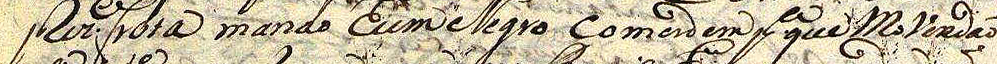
pRez.e frota mando hum Negro com ordem pa que Mo vendaõ
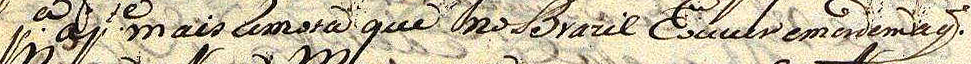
p.a a p.te mais Remota que no Brazil houuer em ordem a q̄
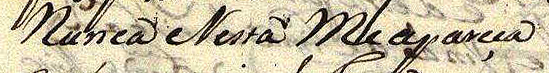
Nunca Nesta Me apareça
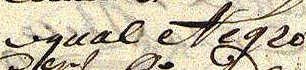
o qual Negro
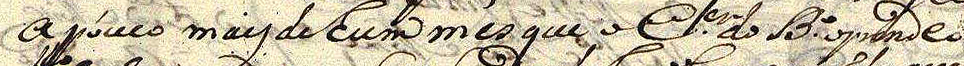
a pouco mais de hum mes que o C.er do B.o o prendeo
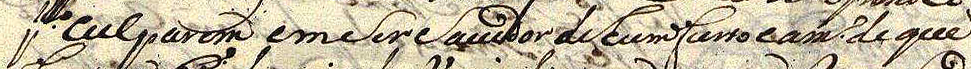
p.lo culparem em Ser Sauedor de hum furto e am.o de que
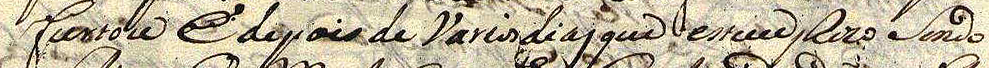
furtou E depois de Varios dias que esteue pRezo sendo
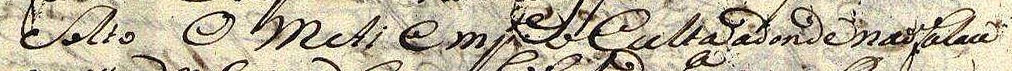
Solto O meti em pte oCulta adonde naõ falace
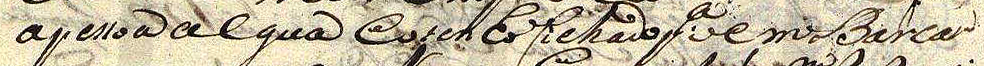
a pessoa algua e o tenho fichado p.a emBarcar
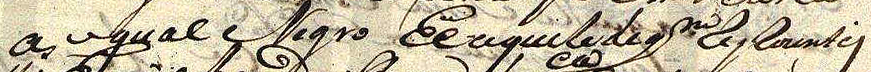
ao qual Negro He aquele de q.m RepRezentej
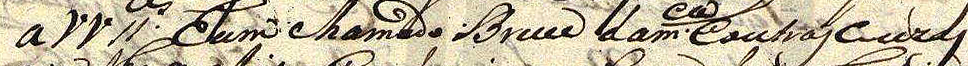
a VV SS. hum chamado Breue da m.ca e outras couzas
